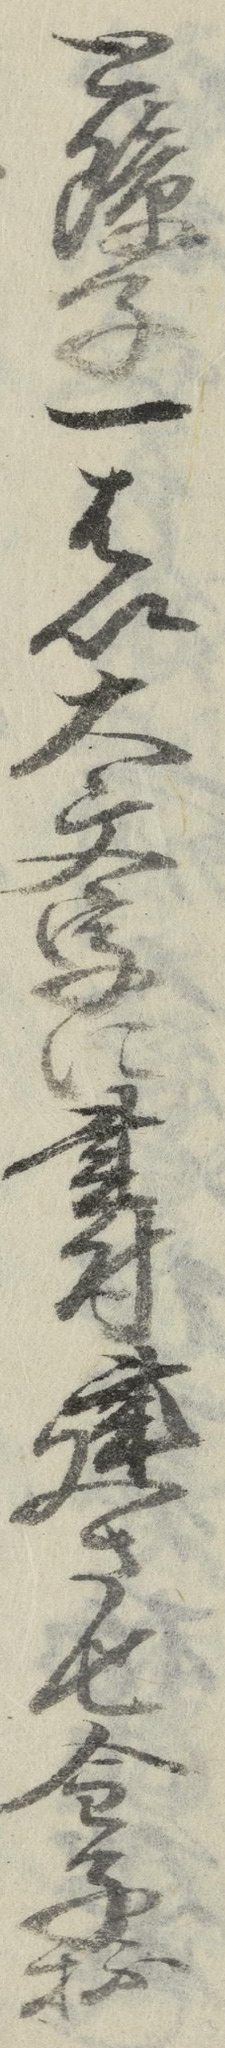と障子一はい大文字に書付建させ金子抔
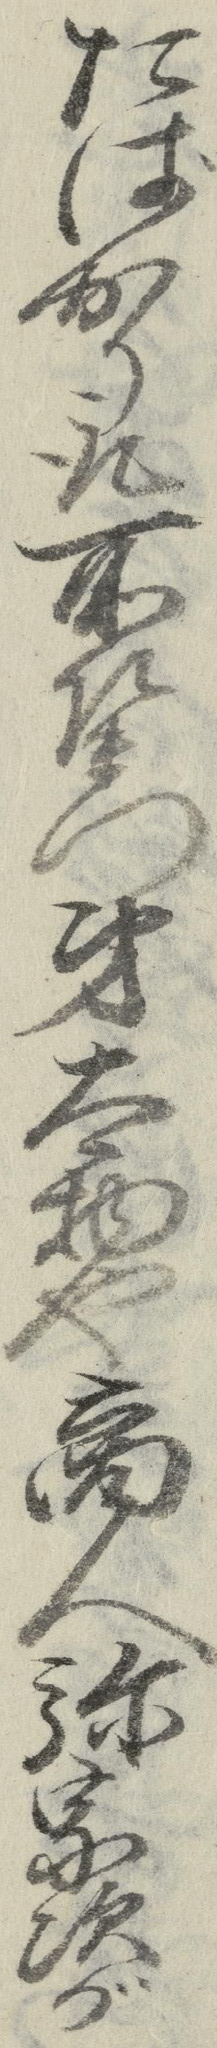たばかり取所左衛門弟太物や商人弥宗次が
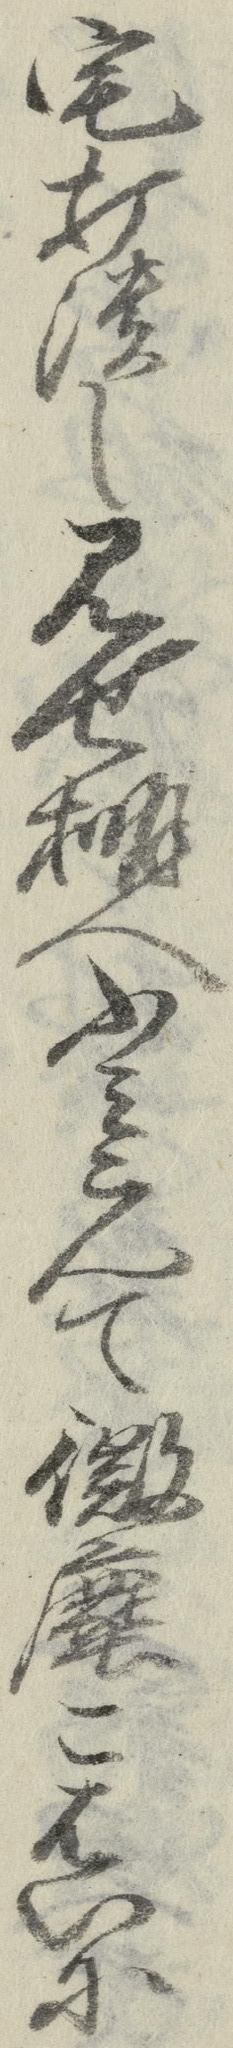宅打潰し見せ棚へふみこんて微塵こはいに
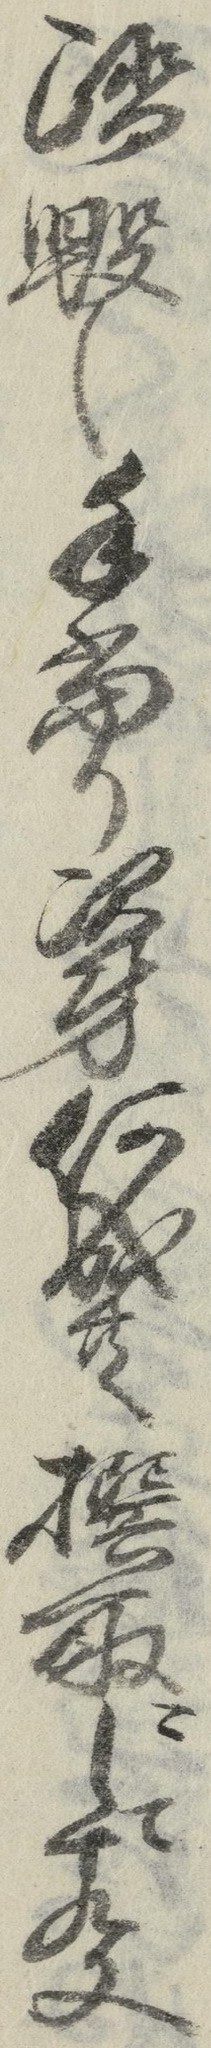踏毀し手当り次第何成共撰取にして十九文
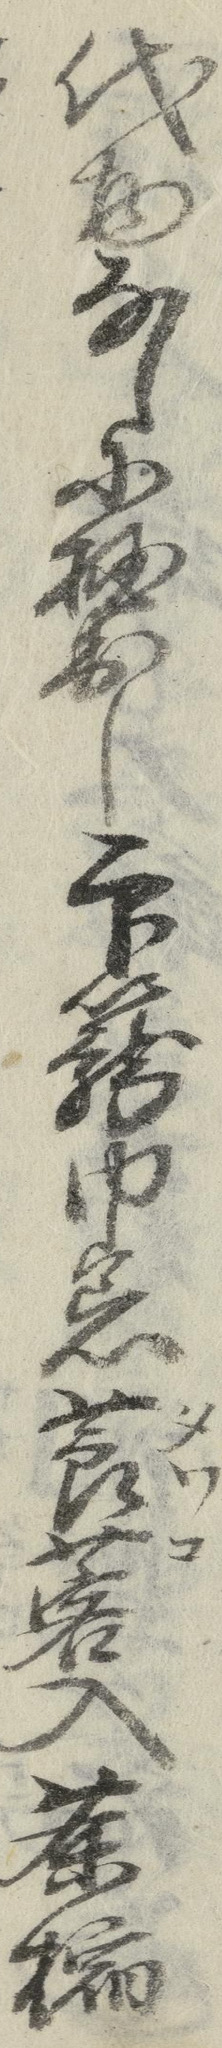代物なしに掴出し印籠巾着-莨菪入茶縮
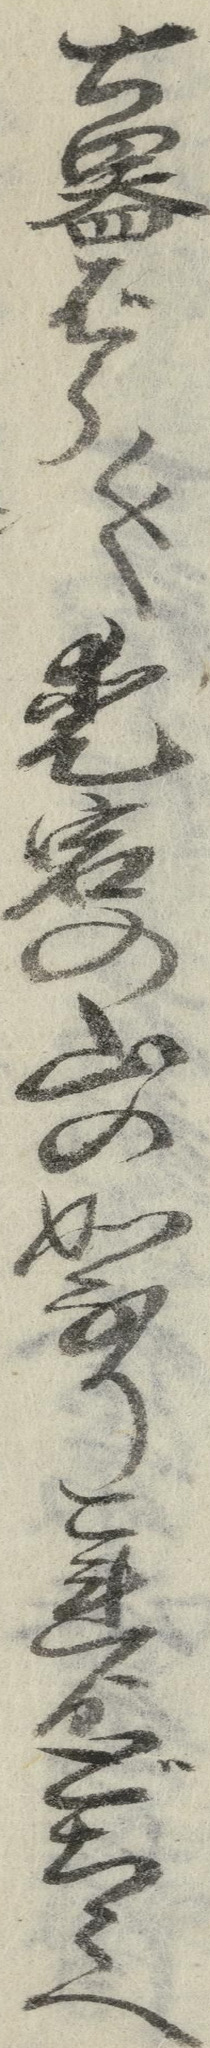-土器ばら〳〵愛宕の山の如なりこれゟどちらへ
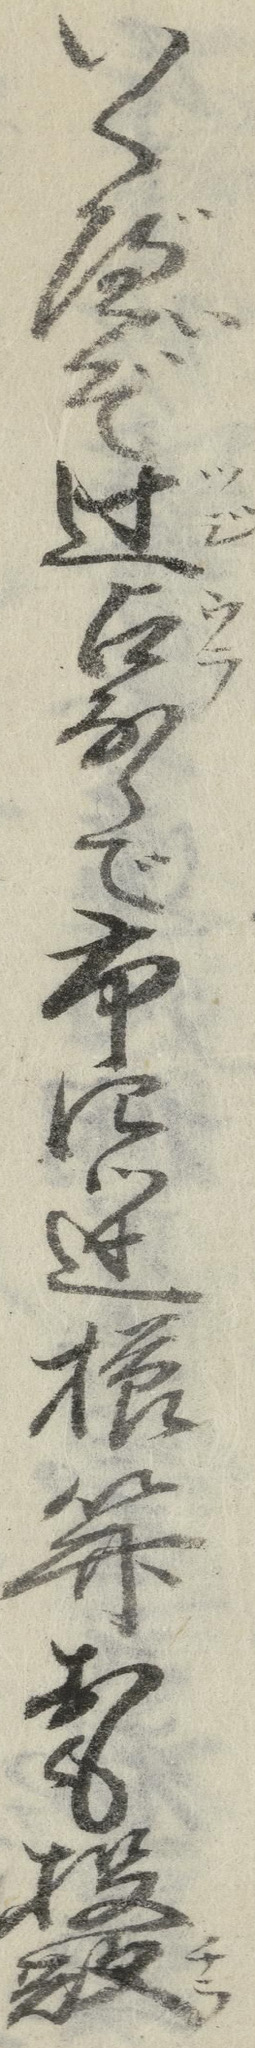いくべいぞ-辻占ならで市四ツ辻櫛笄おも投-散
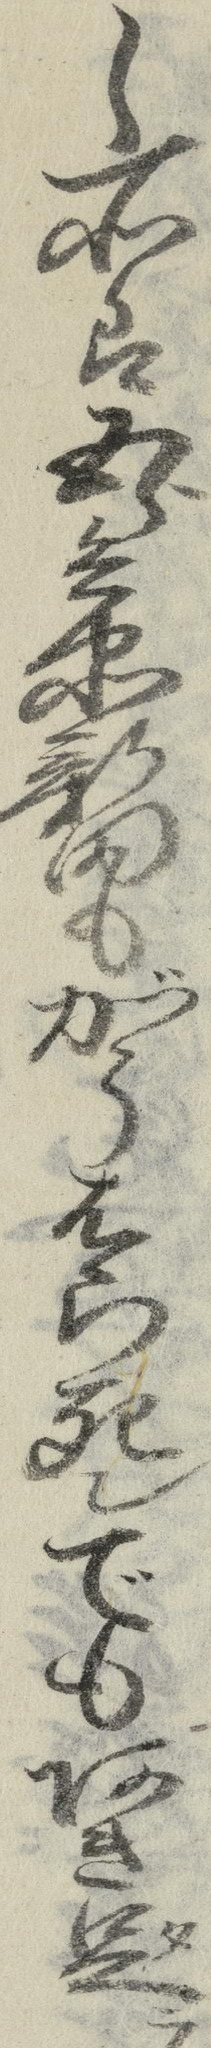し所は五郎兵衛新田もがうはら死しでもあき-足
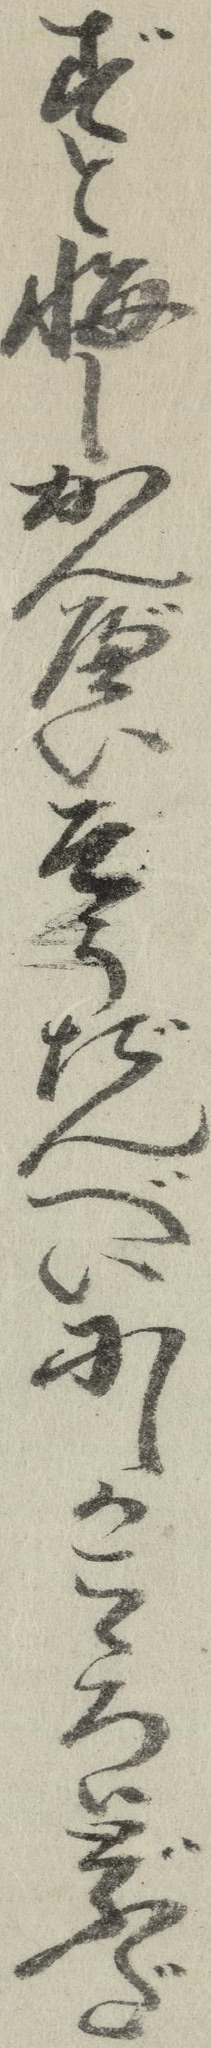ずと悔しかんべいそうだんべいにしかこゝろいどふだ
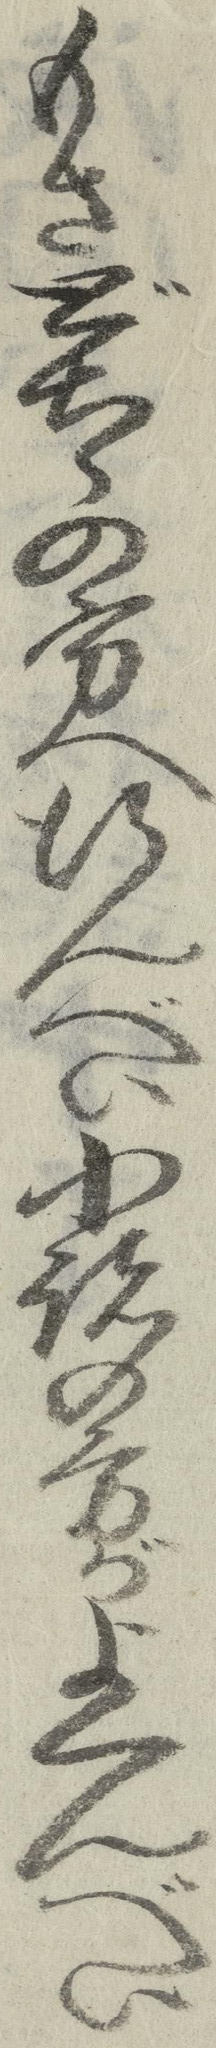もさどちらの方へ行んべい小諸の方がよくんべい
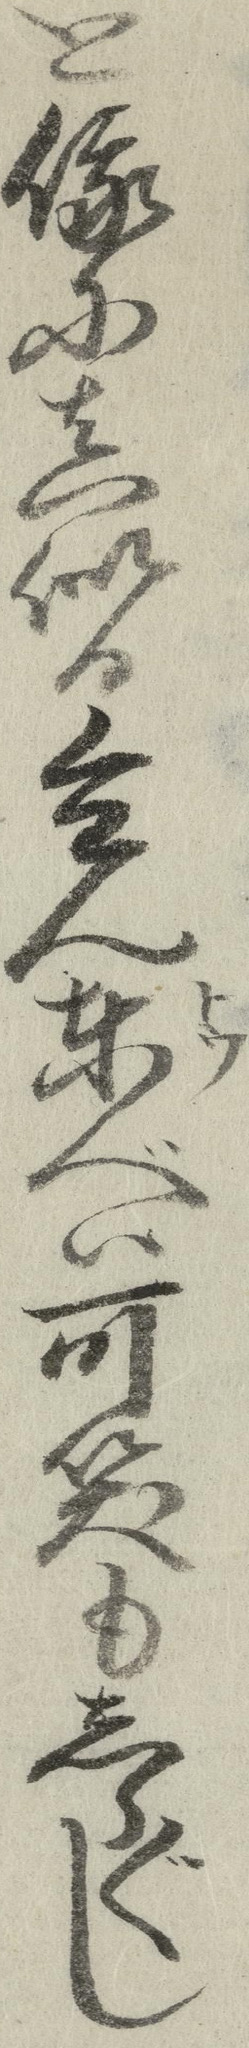と俄に真似る主人-東べい可笑もしら〴〵し
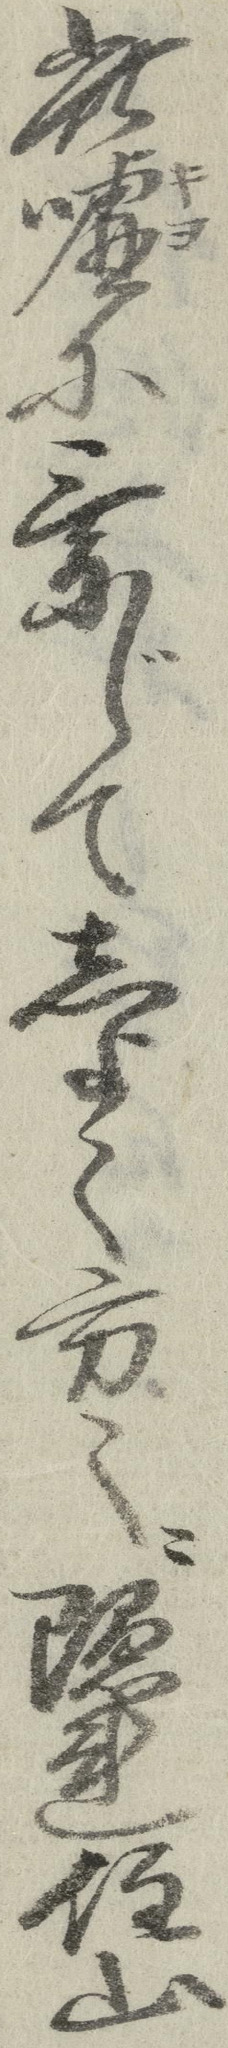此-嘘に乗じてしよ〳〵方々に隠れ住山
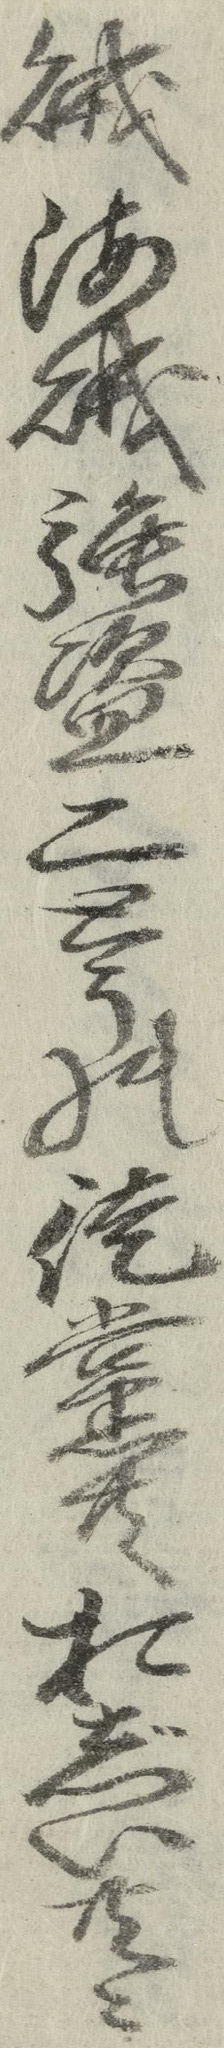賊海賊強盗二とうの徒党共たじい共に
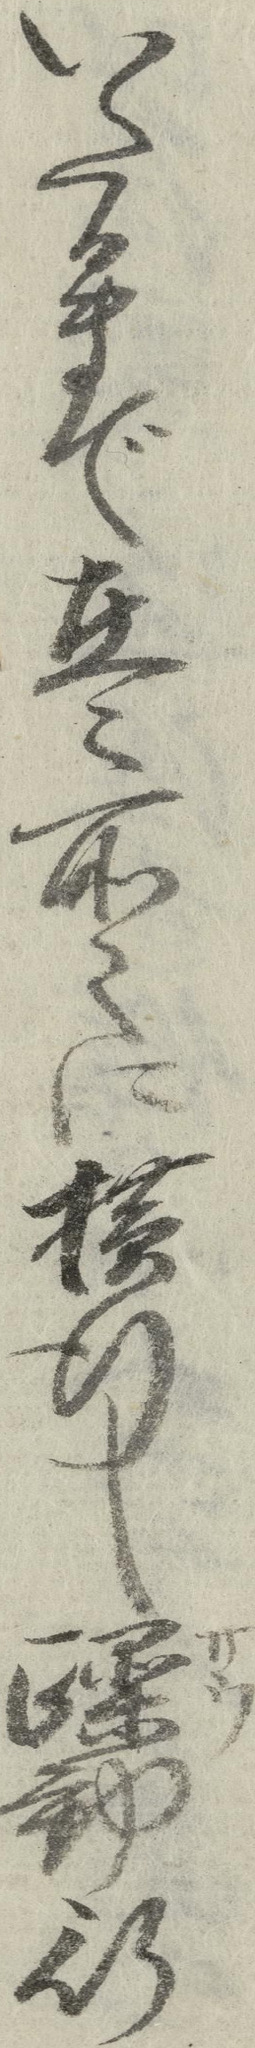いたるまで在々所々に横行し-躁動行
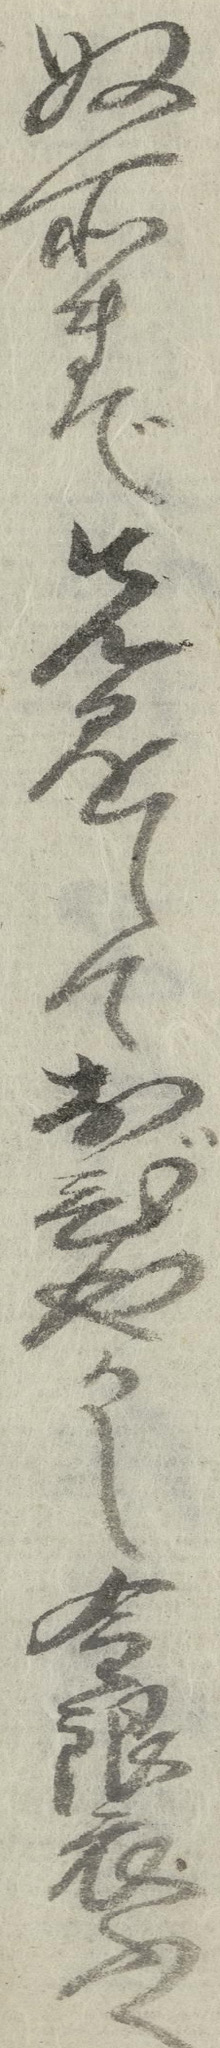ぬ所まで先懸しておびやかし金銀衣ふく
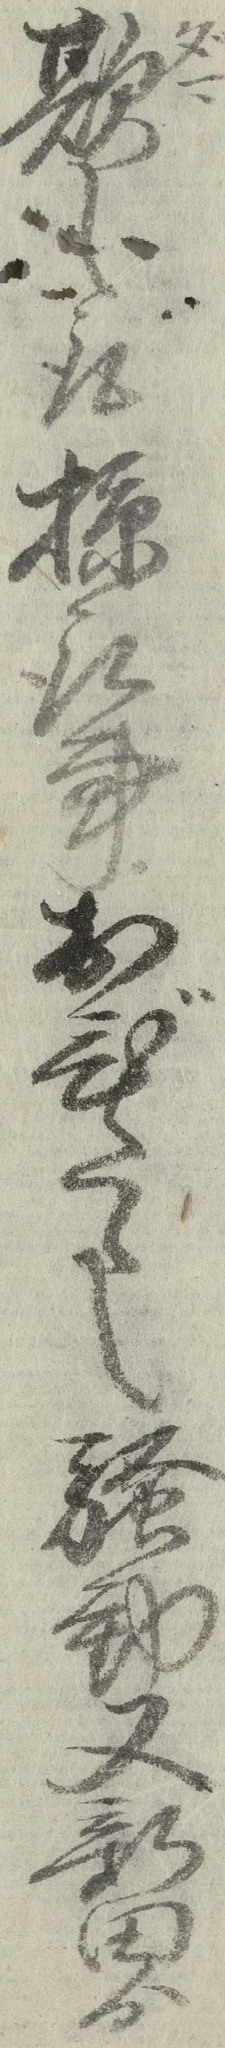-欺し取掠取事おびたゝし騒動又新田ゟ
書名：浅間大焼騒動記　中
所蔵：東京大学地震研究所図書室 Earthquake Research Institute Library, The University of Tokyo, JAPAN
